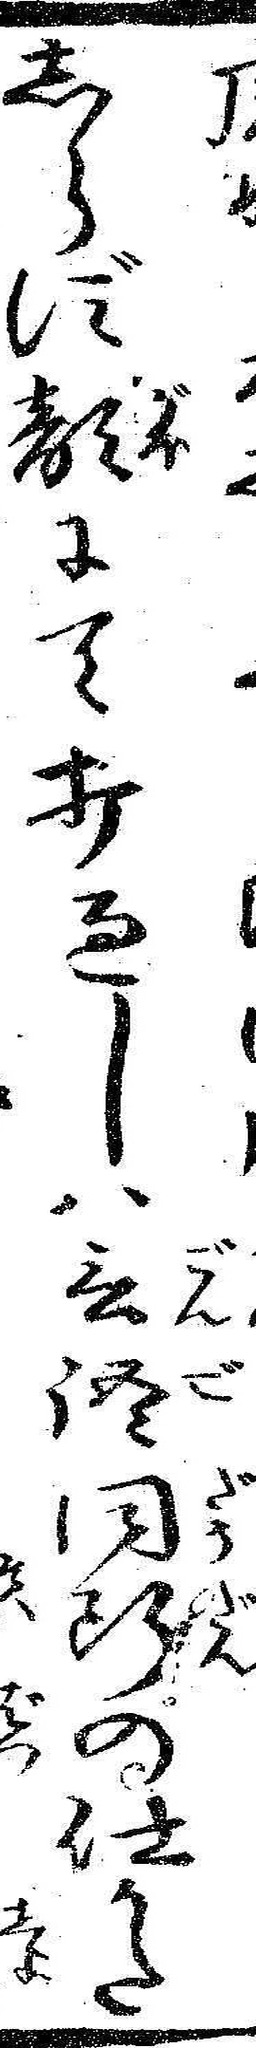しらず顔にて打過しは言語同断の仕かた
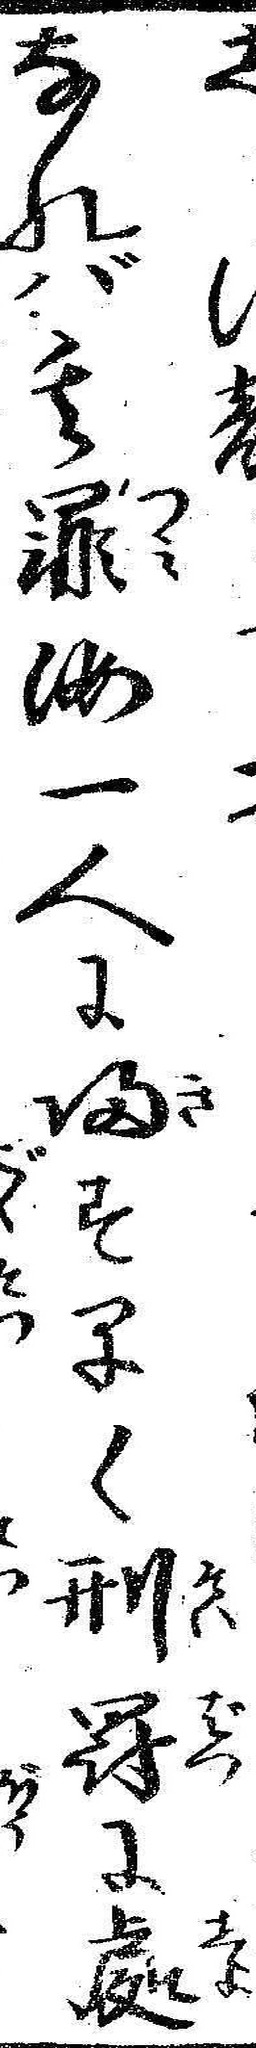なれば其罪汝一人に帰す早く刑罰に処
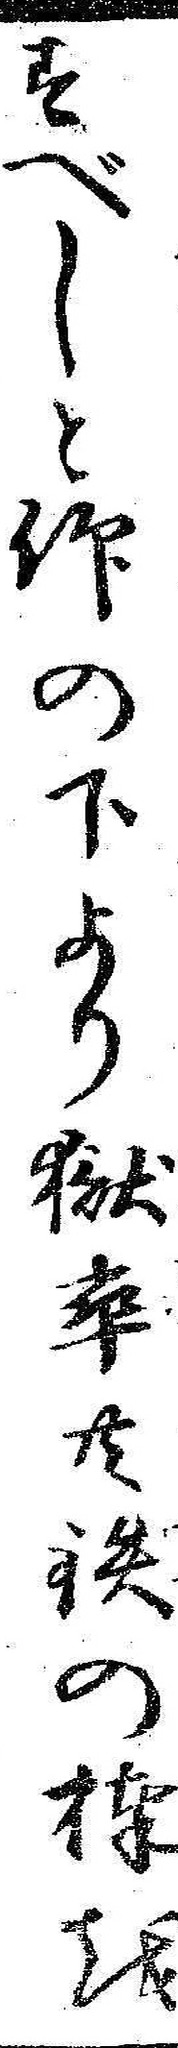すべしと仰の下より獄卒共鉄の棒を
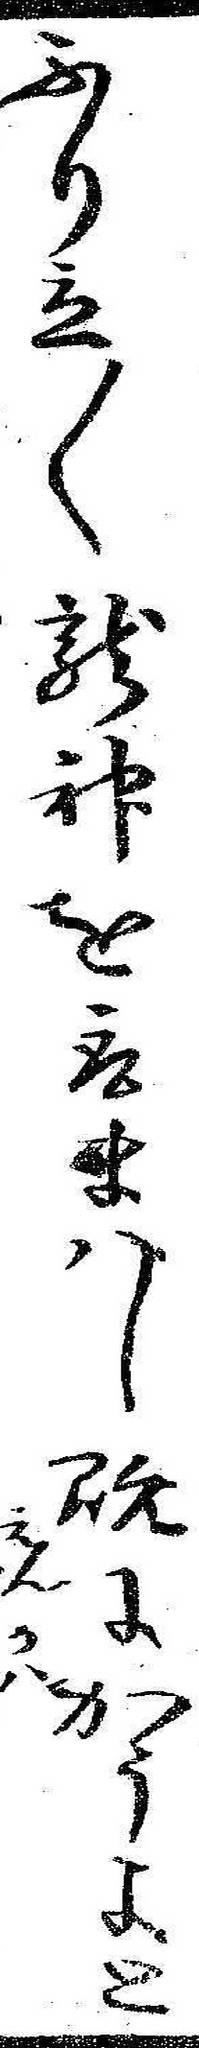ふり立〱竜神を取まはし既にかうよと
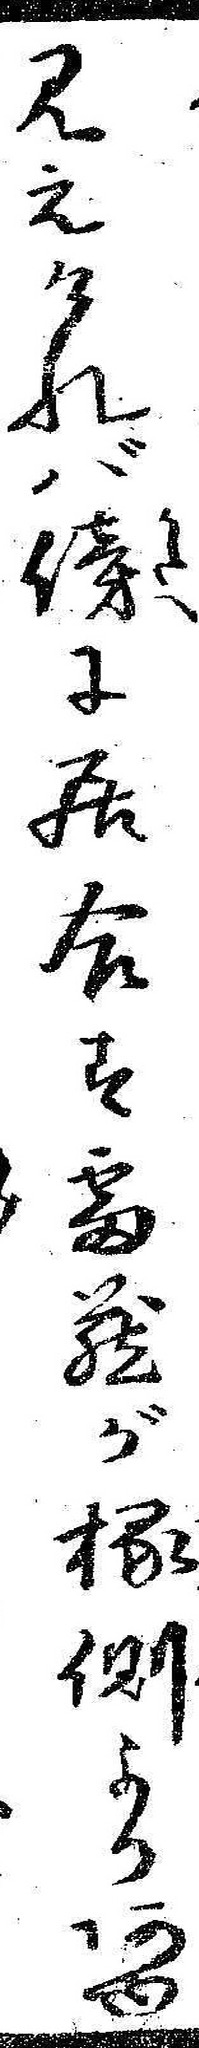見えければ傍に居合す雷蔵が椽側よりあゆ
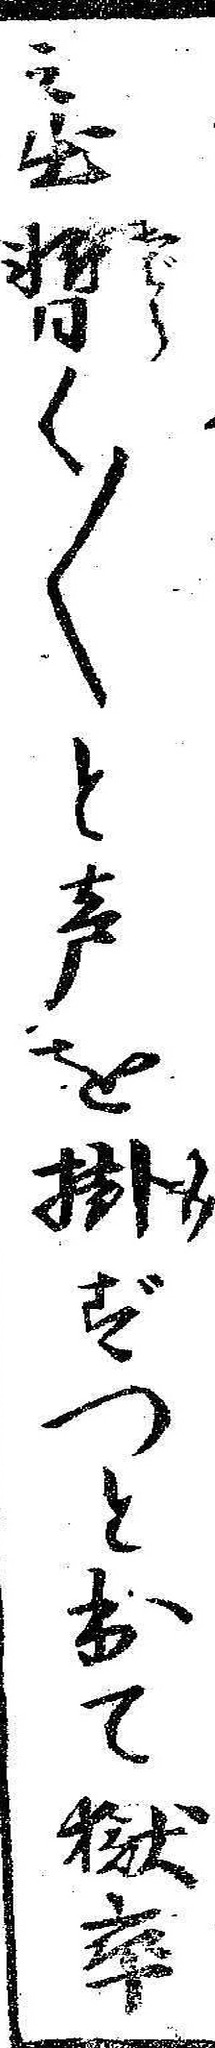み出暫く〱と声を掛ずつと出て獄卒

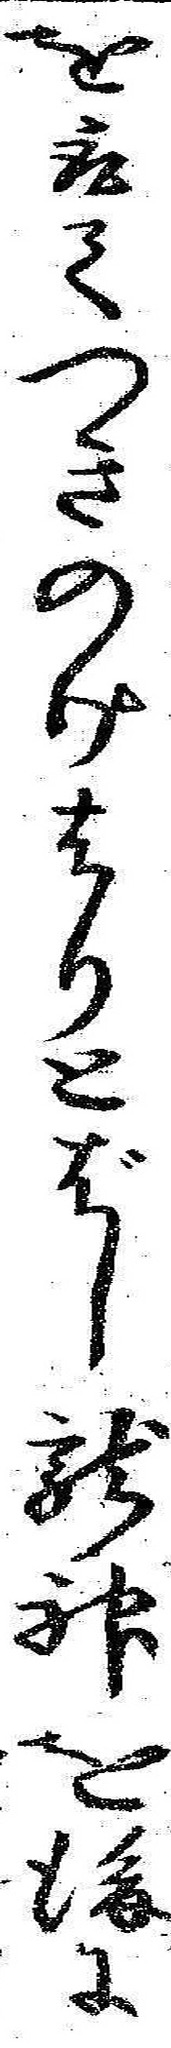を取てつきのけはりとばし竜神を後に
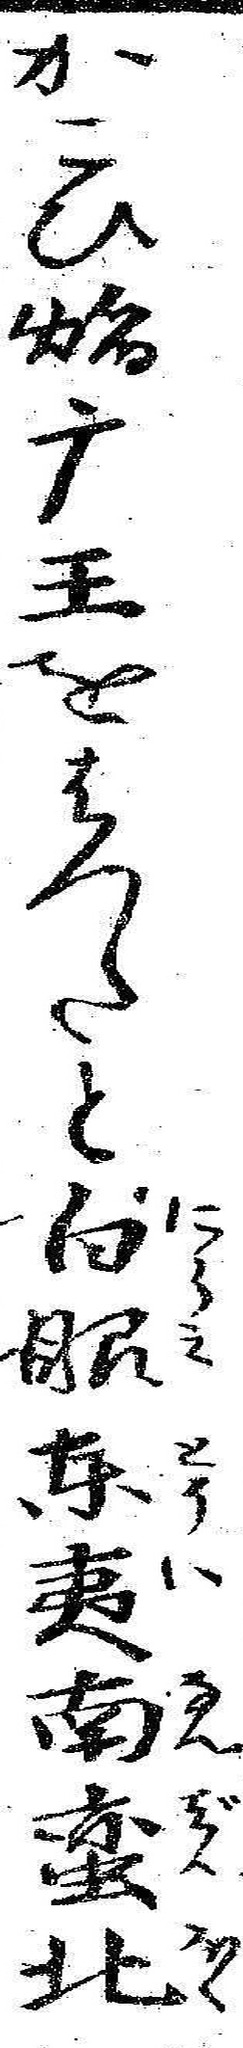かこひ焔魔王をはつたと白眼東夷南蛮北
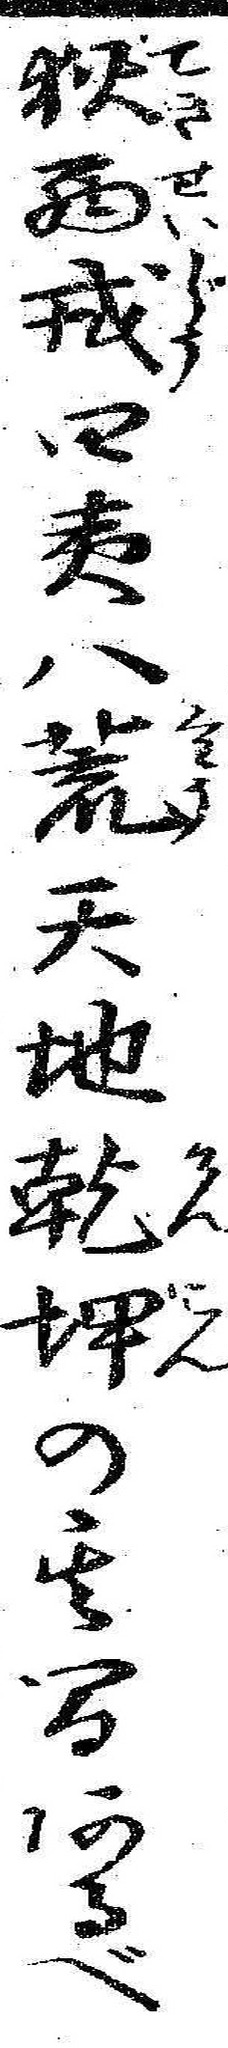狄西戎四夷八荒天地乾坤の其間あるべ
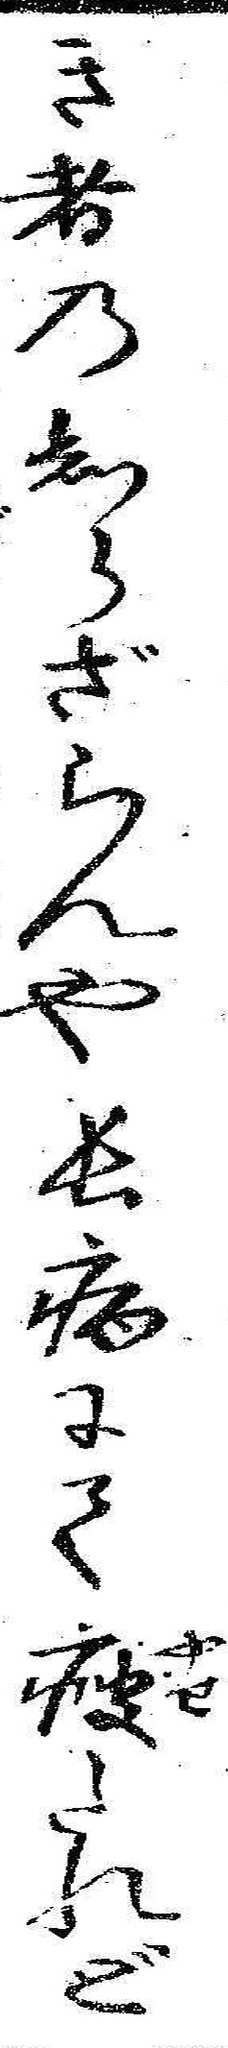き者の知らざらんや長病にて痩たれど
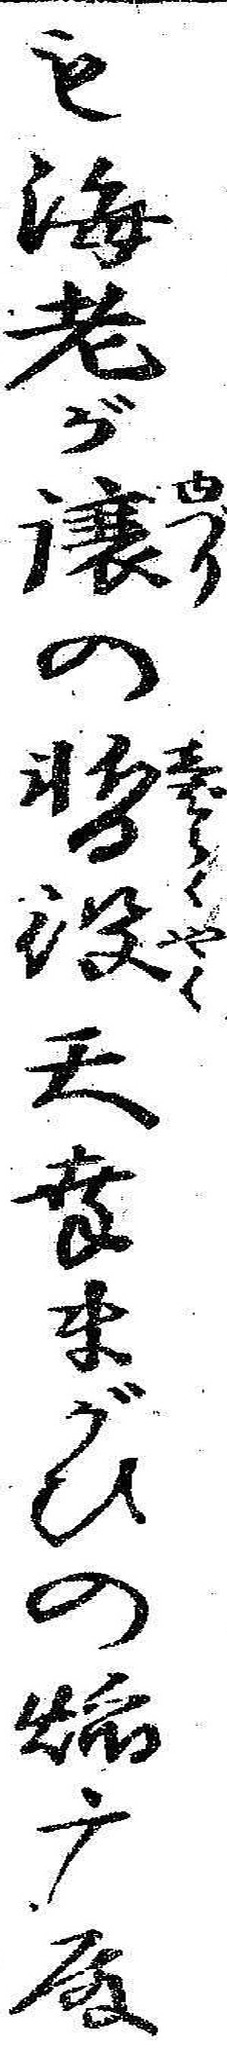も海老が譲の暫役天幸まがひの焔魔殿
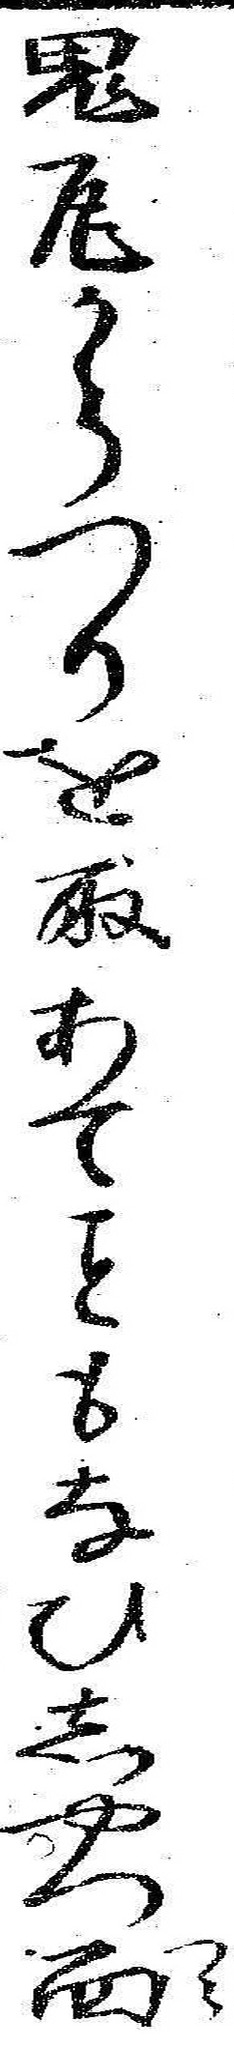鬼瓦からつりを取あてこともなひしやつ面
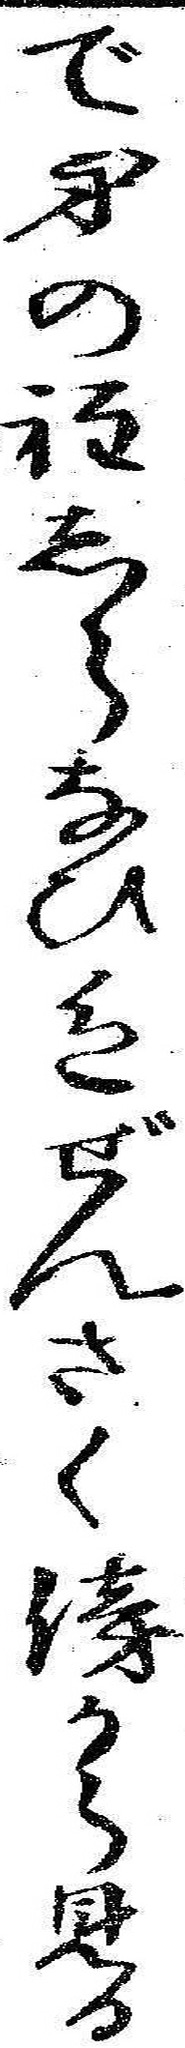で身の程しらなひ色ぜんさく傍から見る
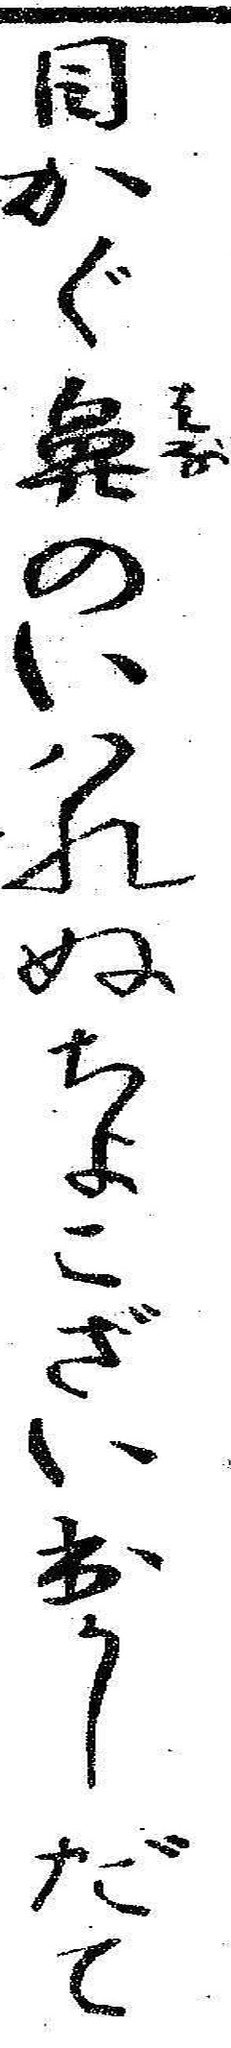目かぐ鼻のいはれぬちよこざい出かしだて
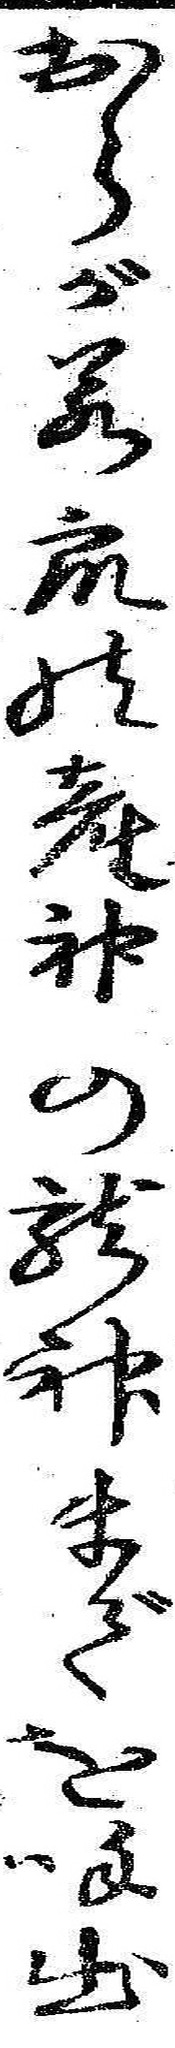おらが若衆の産神の竜神までを呼出
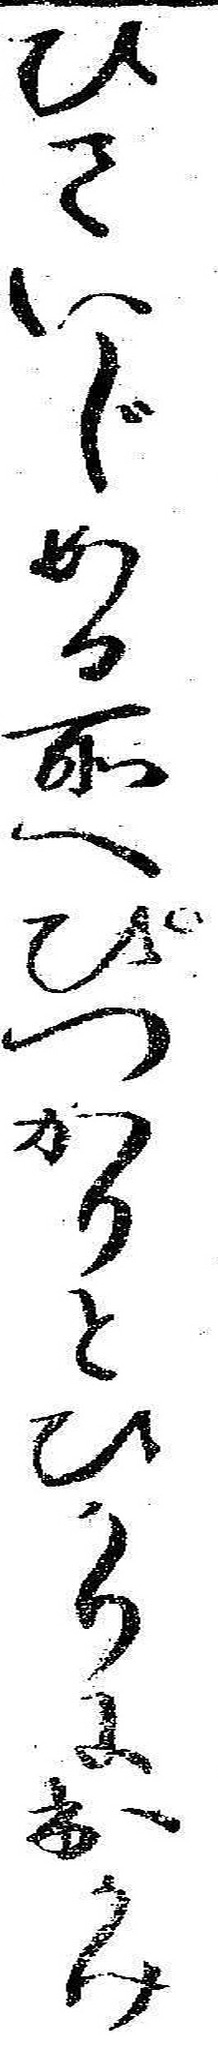ひていじめる所へぴつかりとひかりに出かけ
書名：根無草後編
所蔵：国文学研究資料館
